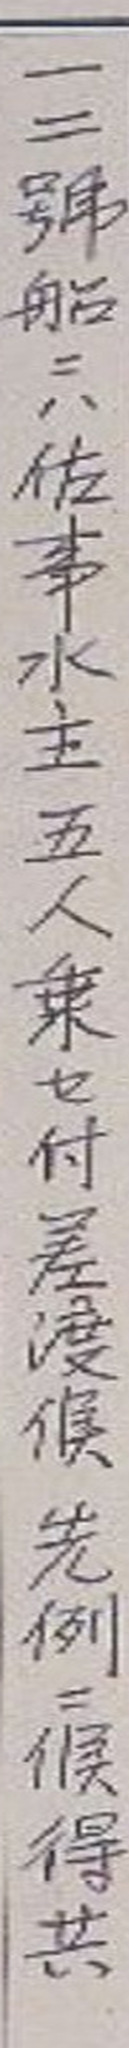一二号船には佐事水主五人乗せ付差渡候先例に候得共

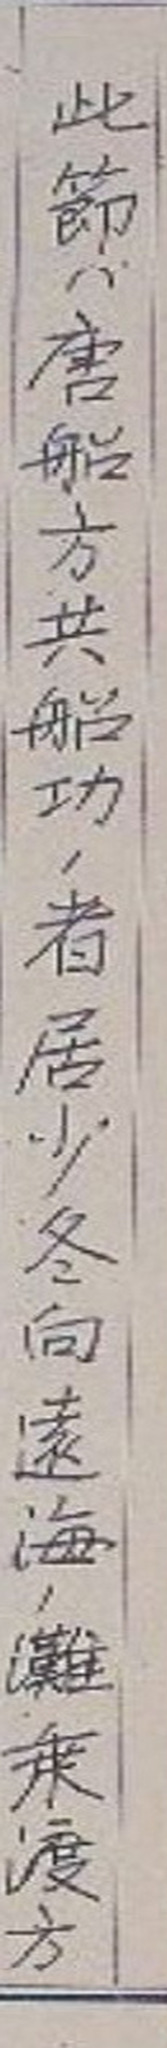此節は唐船方共船功の者居少冬向遠海の灘乗渡方
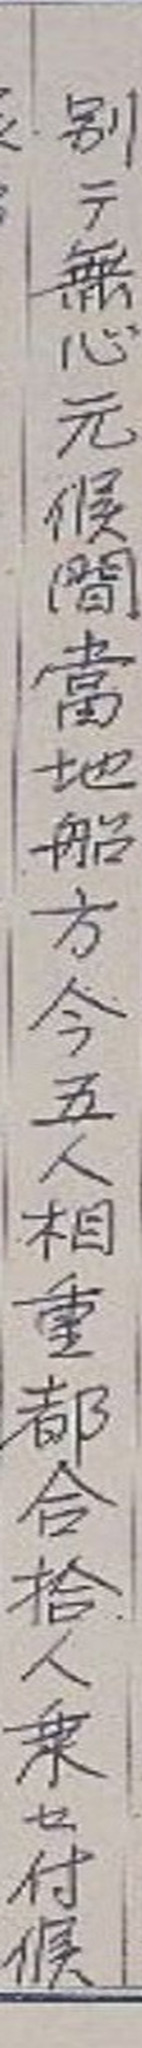別て無心元候間当地船方今五人相重都合拾人乗せ付候
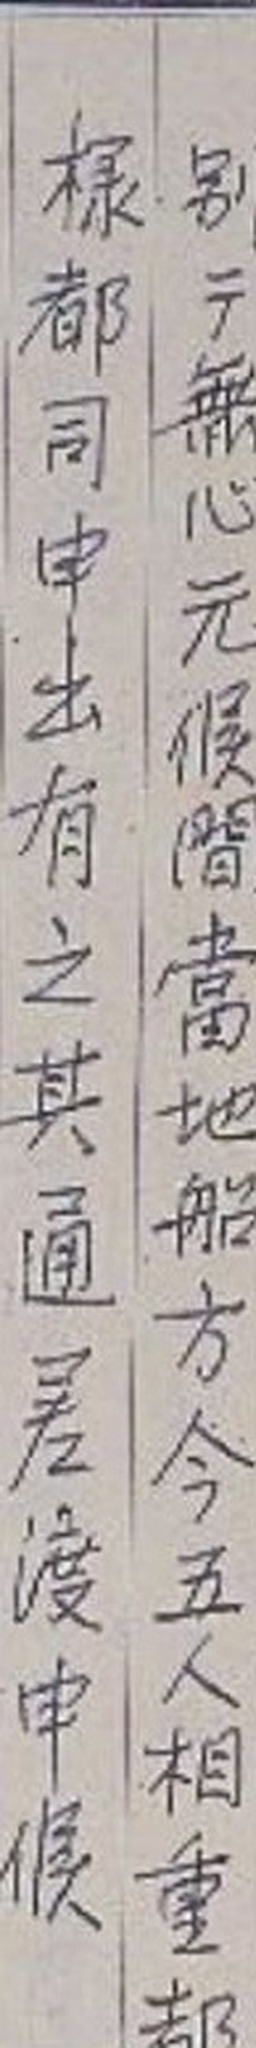様都司申出有之其通差渡申候
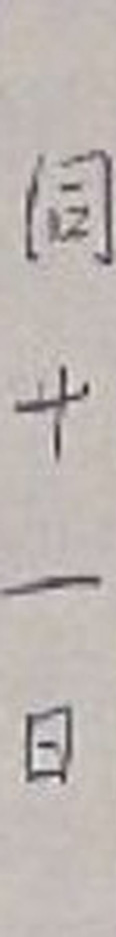同十一日
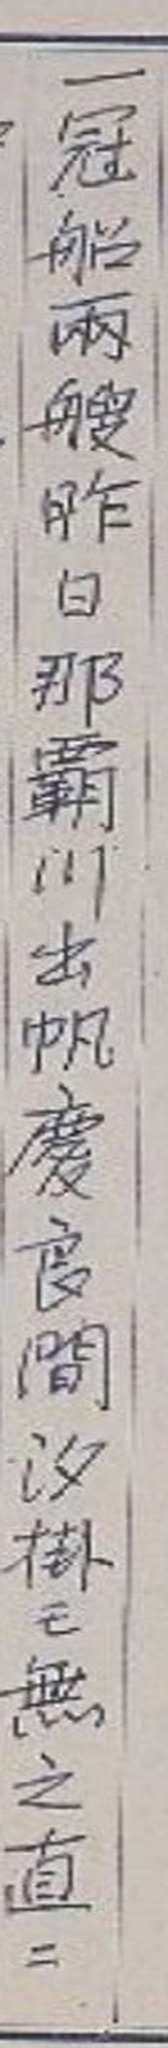一冠船両艘昨日那覇川出帆慶良間汐掛も無之直に
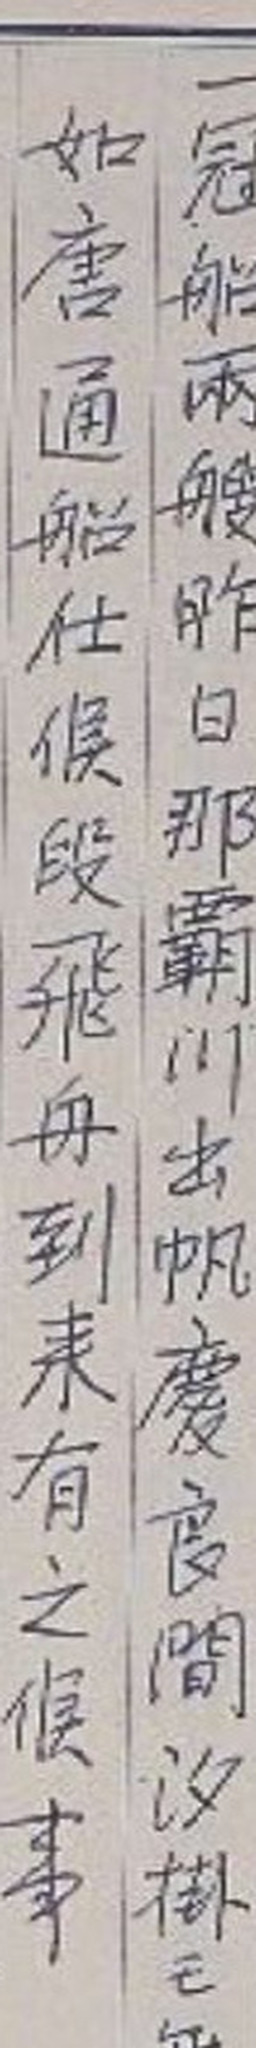如唐通船仕候段飛舟到来有之候事
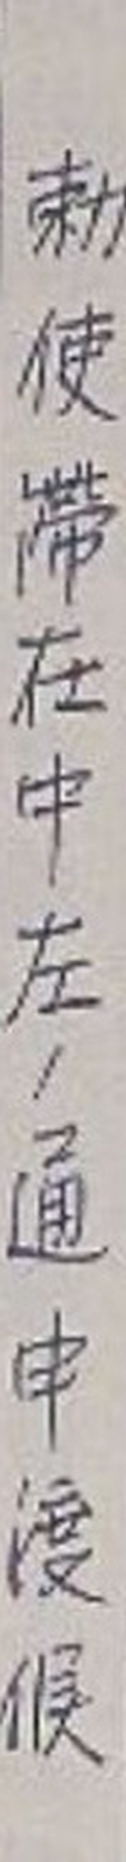勅使滞在中左の通申渡候
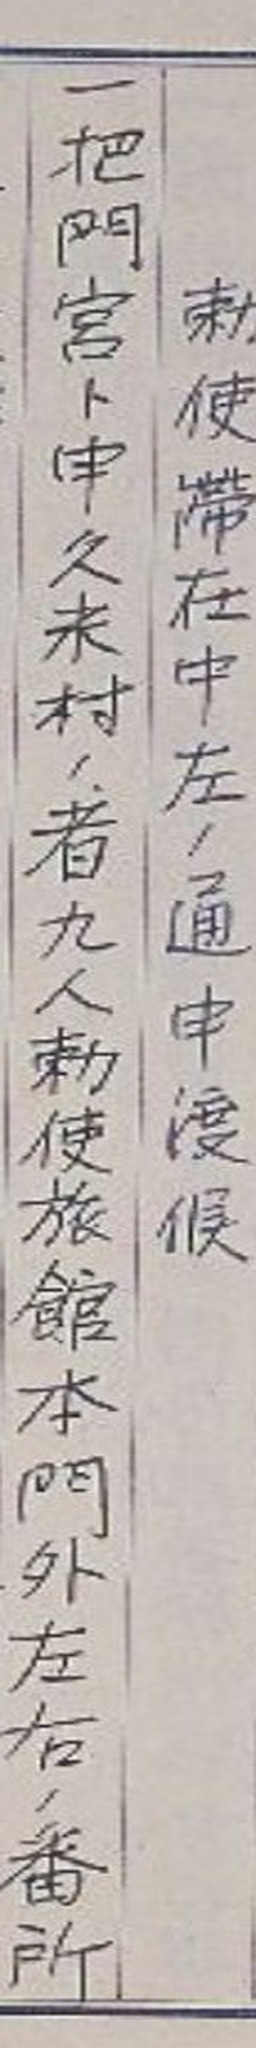一把門宮と申久米村の者九人勅使旅館本門外左右の番所
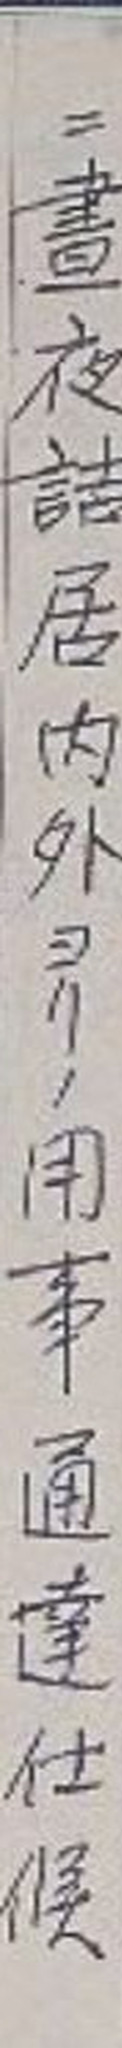に昼夜詰居内外よりの用事通達仕候
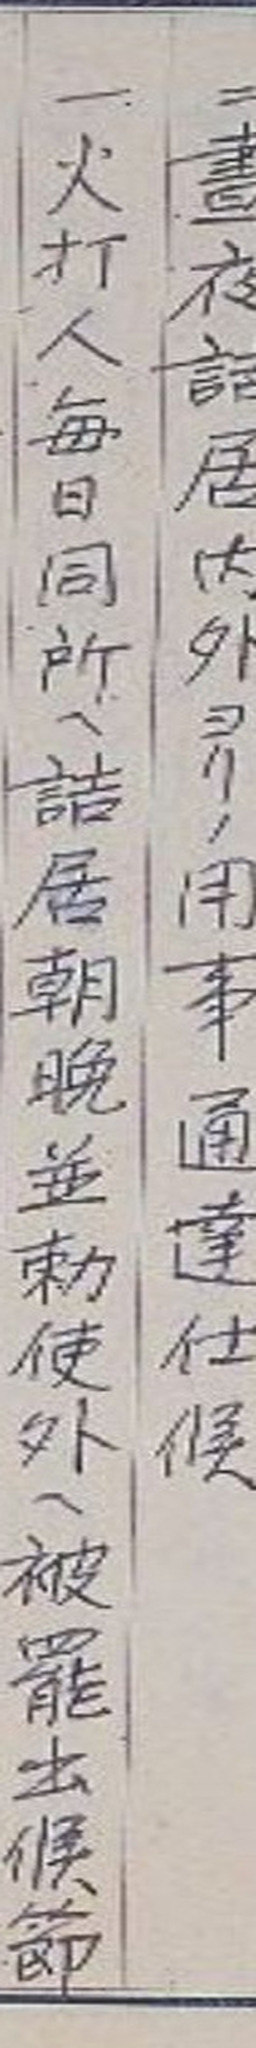一火打人毎日同所へ詰居朝晩並勅使外へ被罷出候節
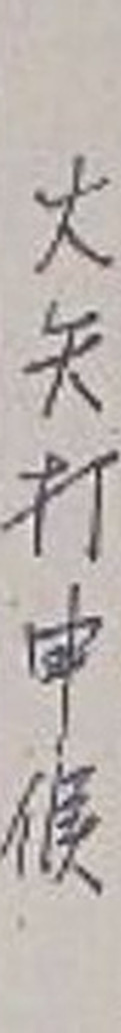火矢打申候
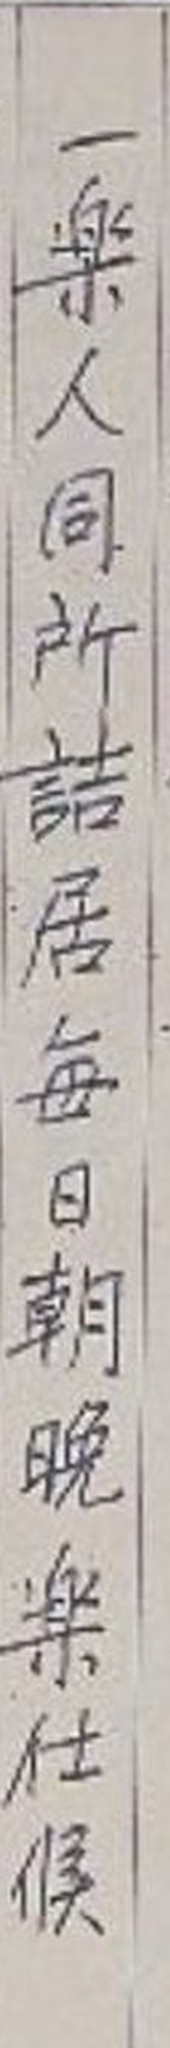一楽人同所詰居毎日朝晩楽仕候
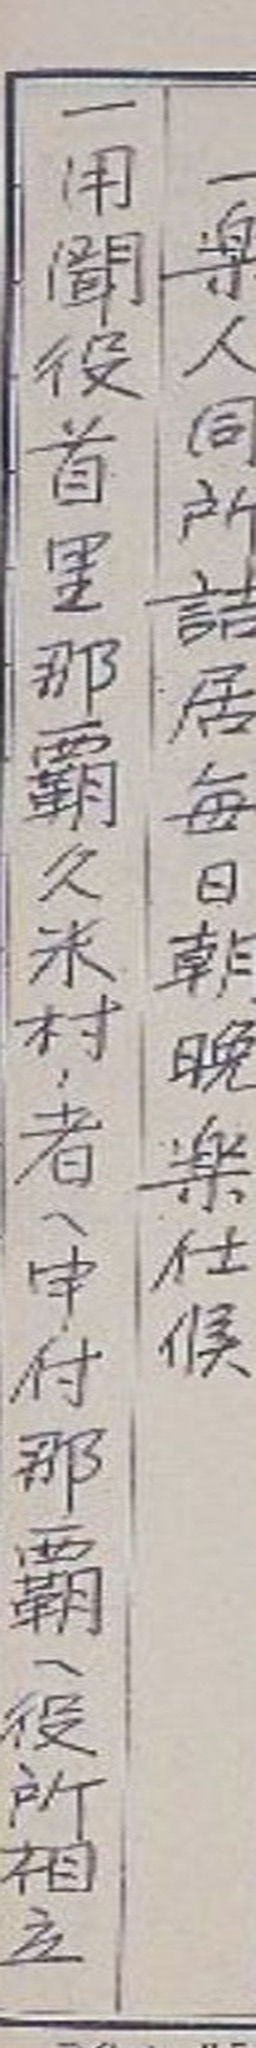一用聞役首里那覇久米村の者へ申付那覇へ役所相立
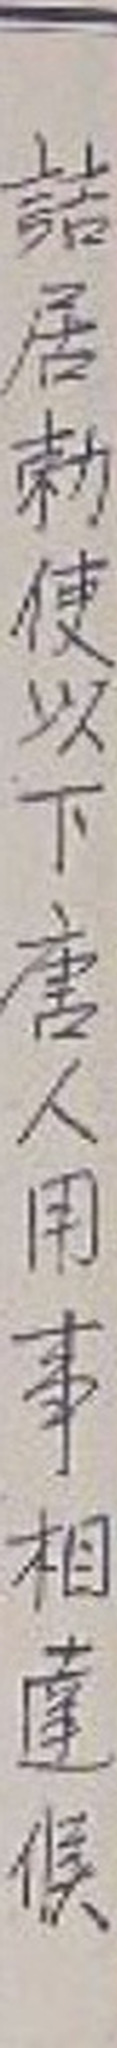詰居勅使以下唐人用事相達候
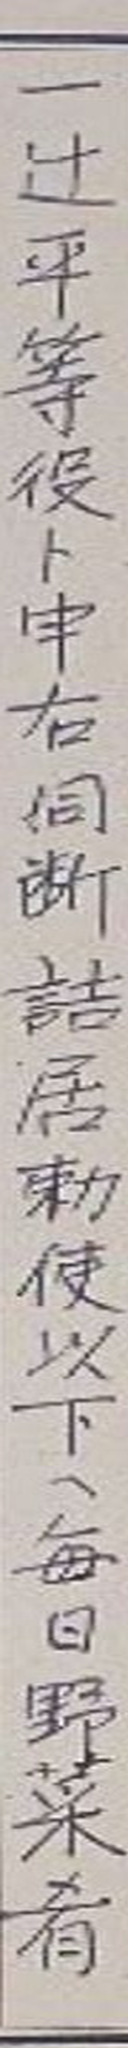一辻平等役と申右同断詰居勅使以下へ毎日野菜肴
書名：支那冊封使来琉諸記 下巻
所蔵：University of the Ryukyus Library
